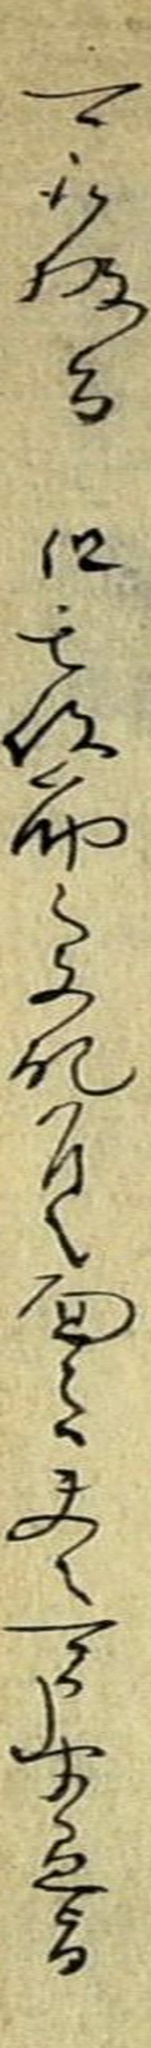可取扱旨但其役筋之支配有之面々ハ夫々可申聞置旨
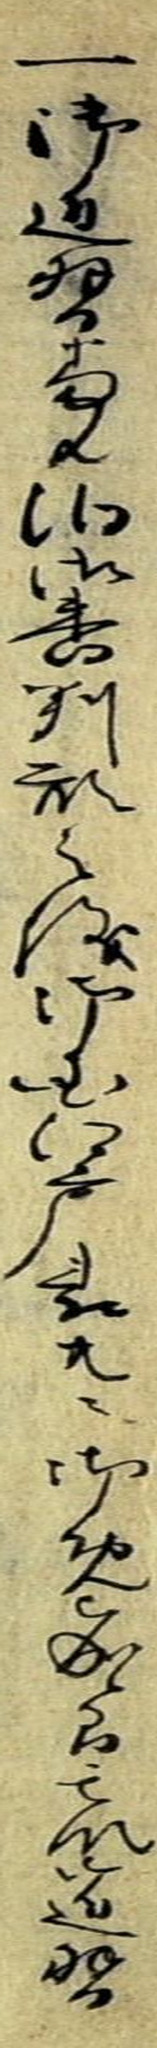一御近習番共泊御番判形之儀御国江戸表共ニ御免被成候間其段御近習
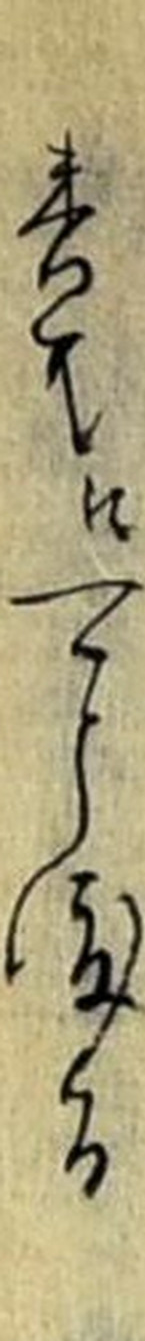番共江可申渡旨
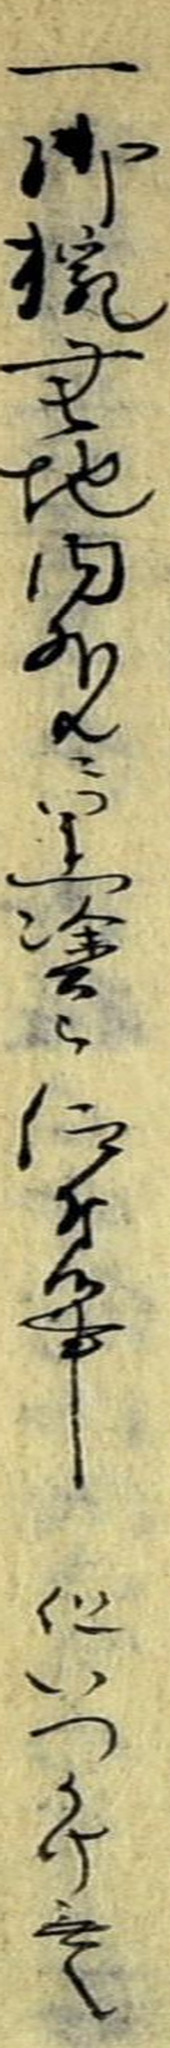一御椀無地内外共ニ黒塗被仰付候事但いつかけ無之
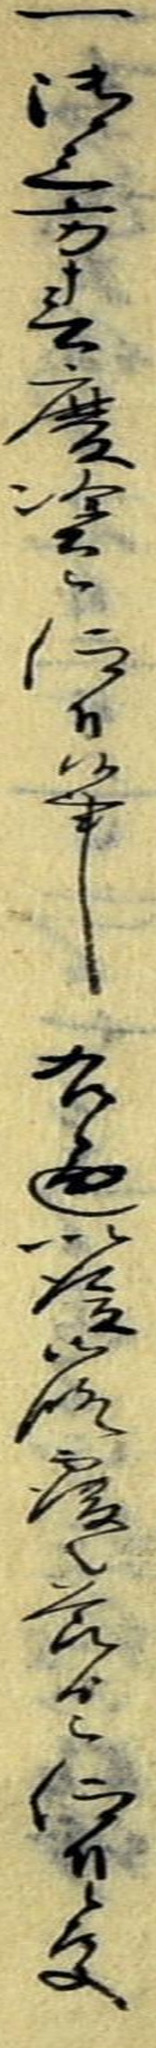一御三方春慶塗被仰付候事右之通以後御修覆之節ゟ被仰付候事

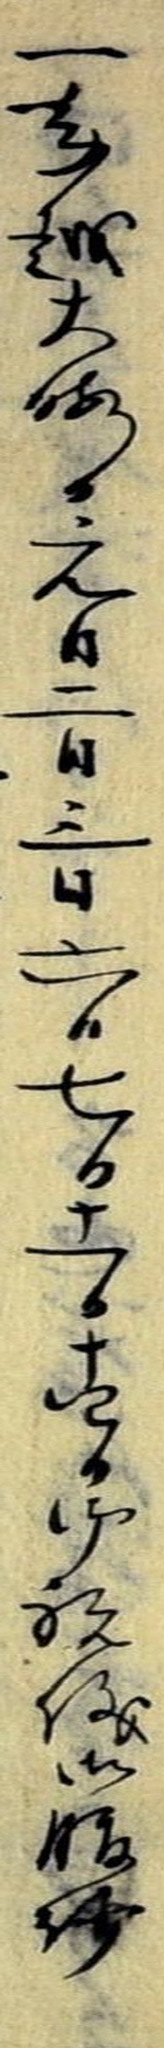一年越大晦日元日二日三日六日七日十一日十四日御祝儀御服紗
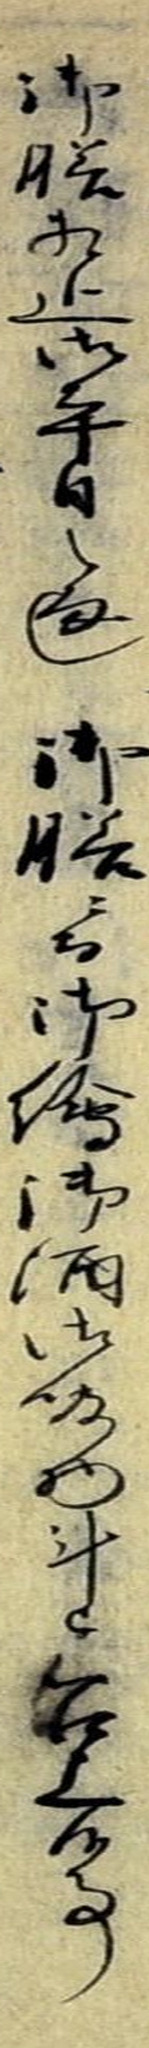御膳相止御平日之通御膳ニ而御膾御酒御吸物斗被召上候事
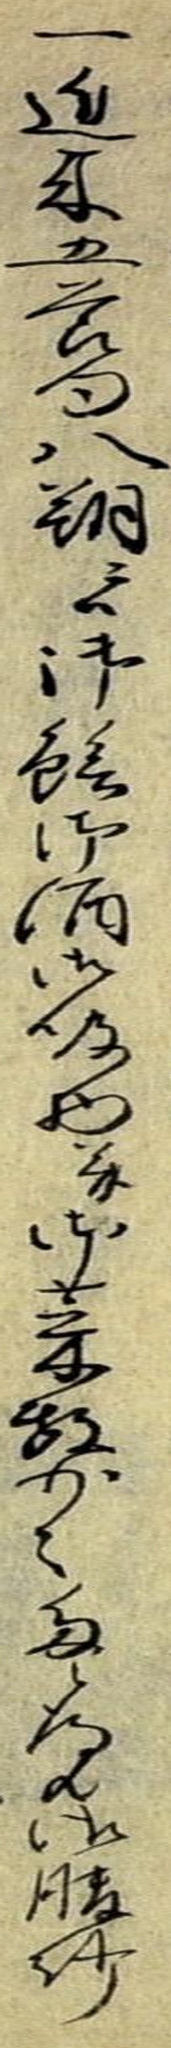一近来五節句八朔ニハ御鱠御酒御吸物并御菜数少々多候得共御服紗
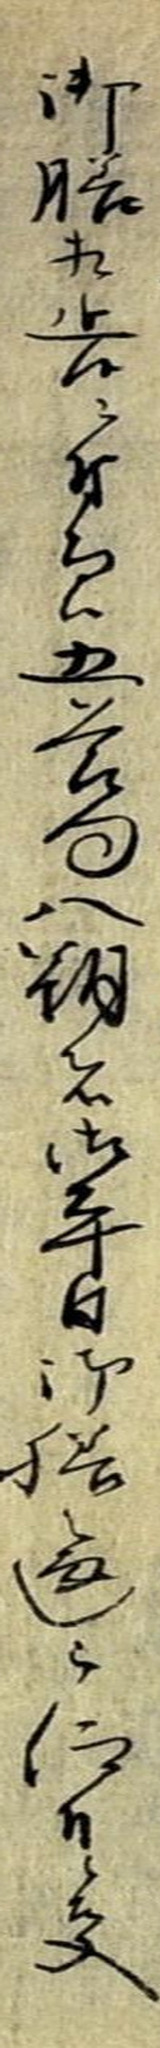御膳相止候ニ付而ハ五節句八朔者御平日御膳之通被仰付候事
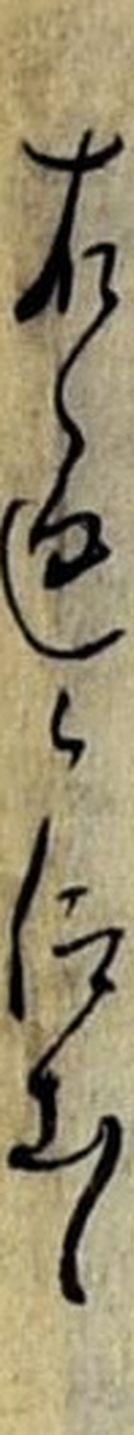右之通被仰出候
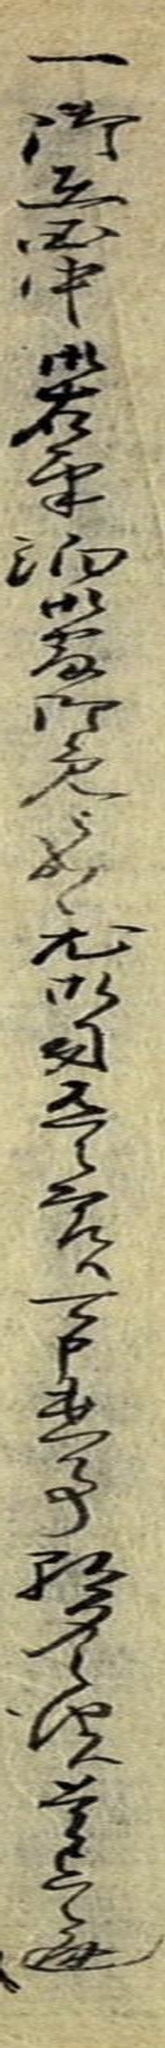一御在国中御右筆泊御番御免被成候尤御用有之節ハ可申遣事朝夕之儀ハ是迄之通也
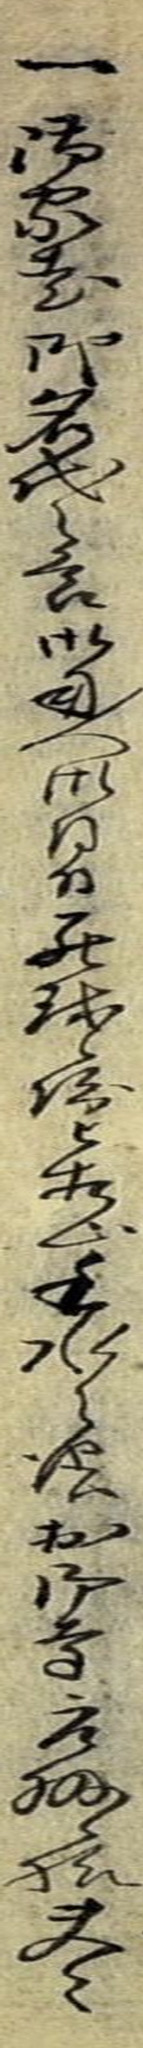一御家老御名代之節御用人御目付罷越候儀被相止手水之儀ハ於御寺取扱候様夫々
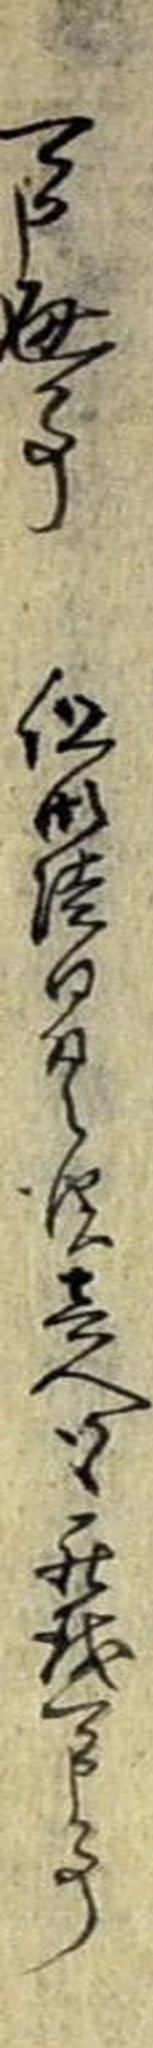可申通事但御徒目付之儀ハ壱人ツヽ罷越可申事
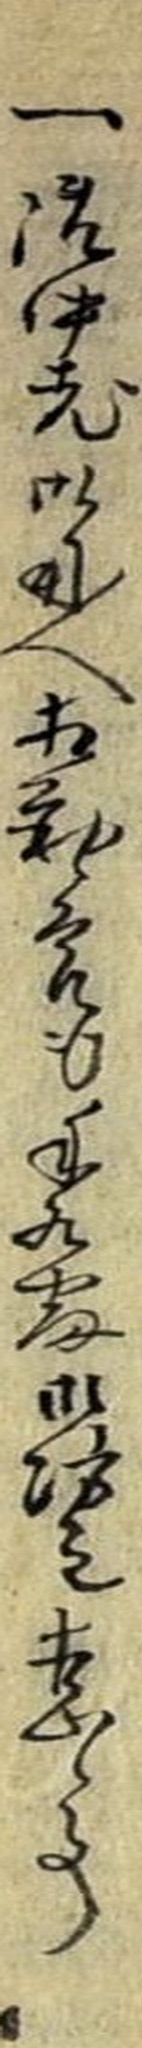一御中老御用人相勤候節も手水番御坊主相止候事
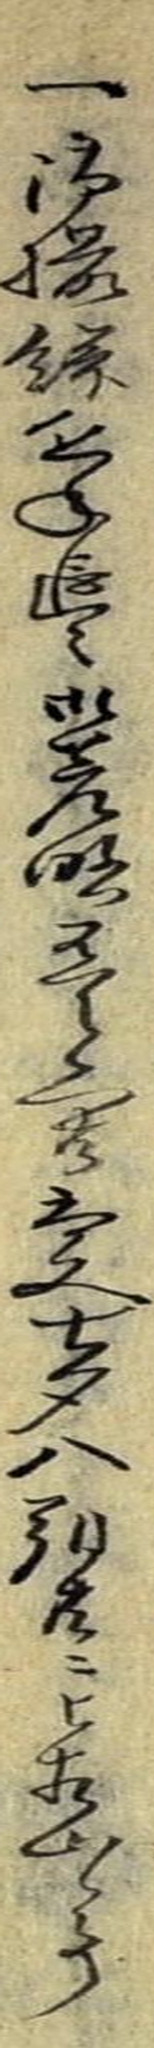一御撮餅近年追々御差略有之候へ共尚又七夕八朔共ニ被相止候事
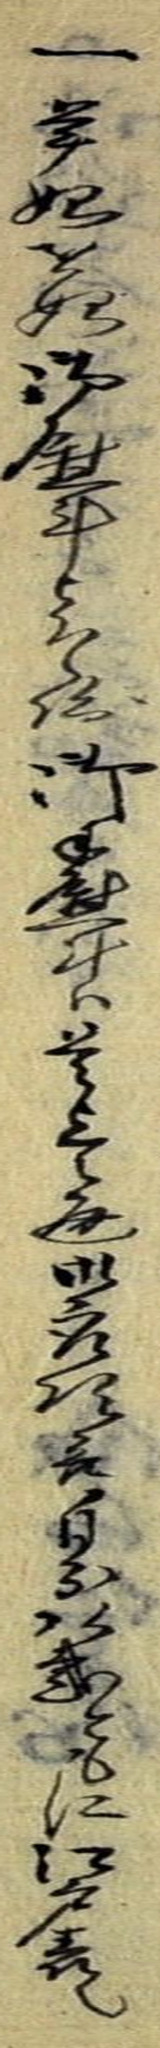一年始を始御熨斗被下候儀御手熨斗ハ是迄之通御取次并自分頂戴ともに江戸表之
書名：命令之部 三
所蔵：福井県文書館 Fukui Prefectural Archives
